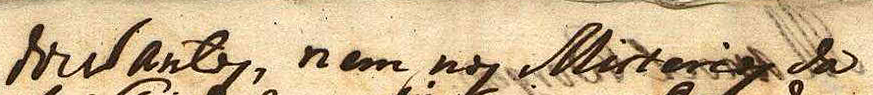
dos Santos, nem nos Misterios da
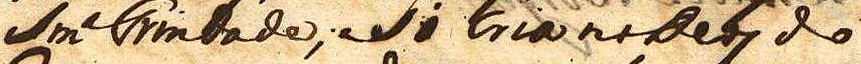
Sma Trindade; e só Cria no Deos do
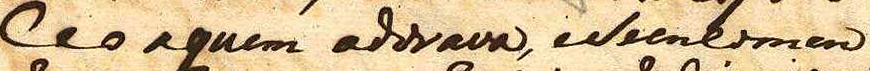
Ceo a quem adorava, e se encomen
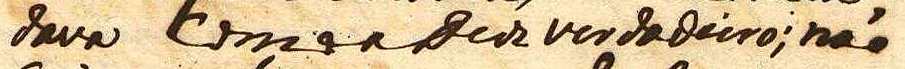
dava como a Deos verdadeiro; naõ
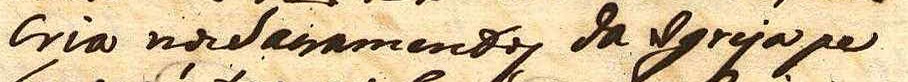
cria nos Sacramentos da Igreja pe
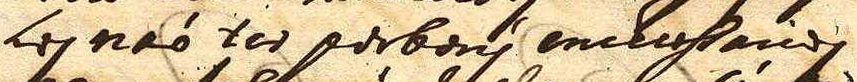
los naõ ter por bons e necessarios
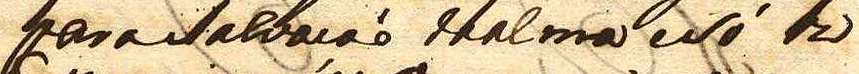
para Salvaçaõ da alma, e só oz
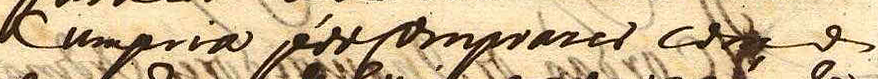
Cumpria por Comprazer com o
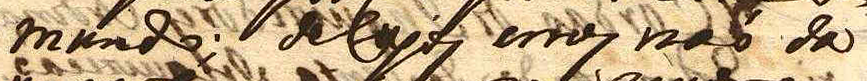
mundo; de Cujos erros naõ da
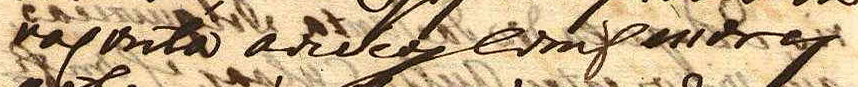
va Conta aos seos comfessores
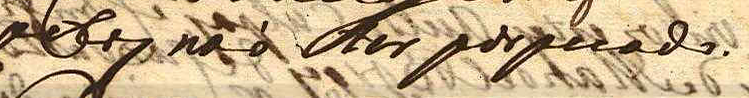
pelos naõ ter por pecado.
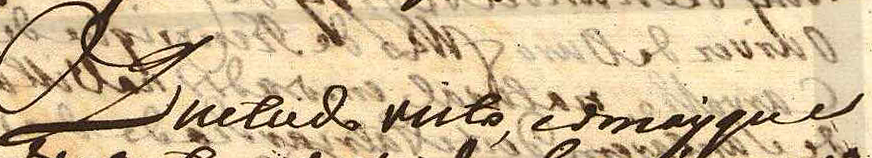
O Que tudo visto, e o mais que
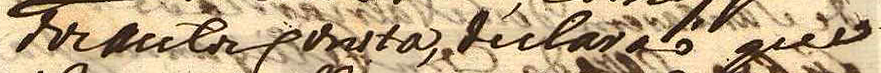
dos autos Consta, declaraõ, que
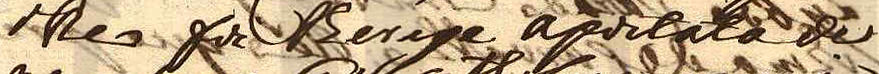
o Reo foi Herege apostata de
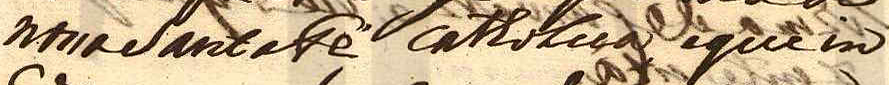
nossa Santa Fé catholica, e que in
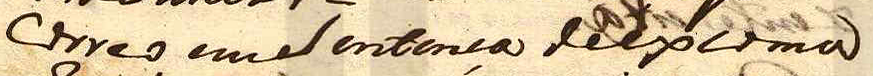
Correo em Sentença de Excomu
